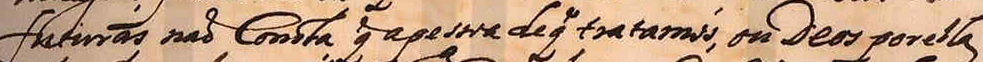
futuras, naõ Consta, q̄ a pessoa de q̄ tratamos, ou Deos por ella
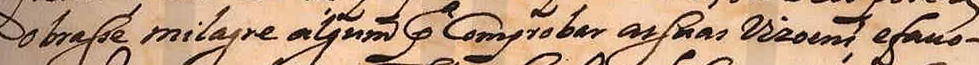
obrasse milagre algum pa Comprobar as suas vizoens̄, e fauo
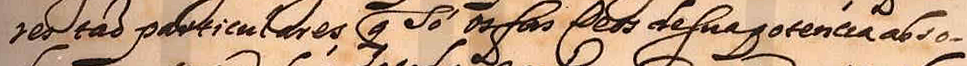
res taõ particulares, q̄ só os fas Deos de sua potencia abso
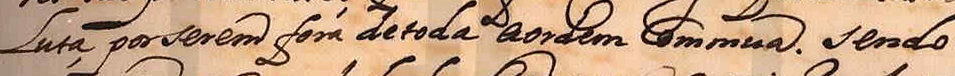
Luta, por serem fora de toda a ordem Commua. Sendo
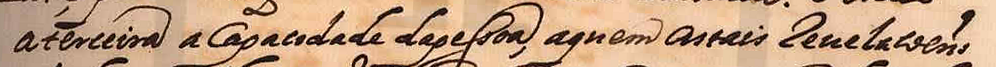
a terceira a capacidade da pessoa, a quem as tais Reuelaçoen̄s
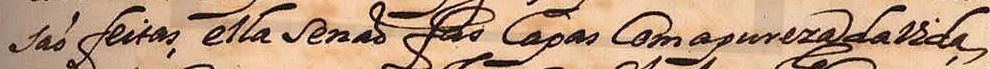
saõ feitas, ella se não fas Capas Com a pureza da vida,
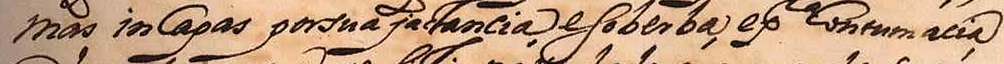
mas inCapas por sua jactancia, e soberba, e p.la Contumacia,
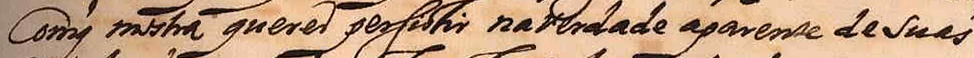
Com q̄ mostra querer persistir na verdade aparente de suas
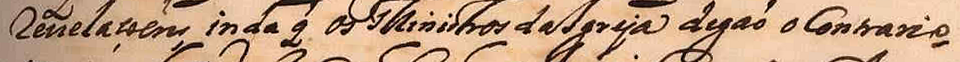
Reuelaçoen̄s inda q̄ os Ministros da Igreja digaõ o Contrario
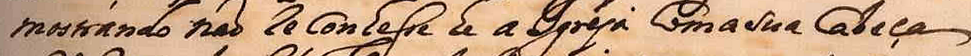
mostrando naõ Reconhesse he a Igreja Com a sua Cabeça
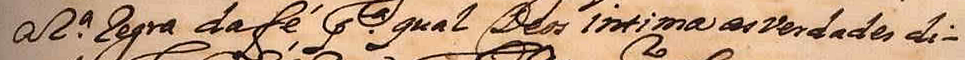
a 2.a Regra da fé, p.la qual Deos intima as verdades di
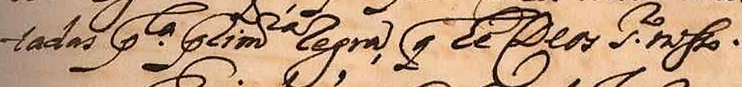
tadas p.la pRimra Regra, q̄ he Deos s.ro nosso.
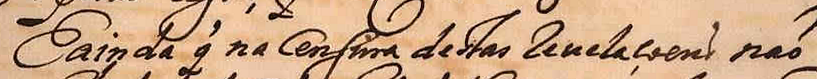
E ainda q̄ na Censura destas Reuelaçoens̄ naõ
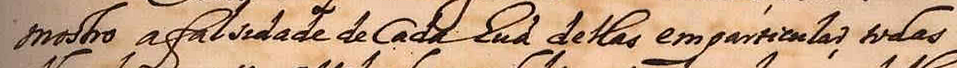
mostro a falsidade de Cada huā dellas em particular, todas
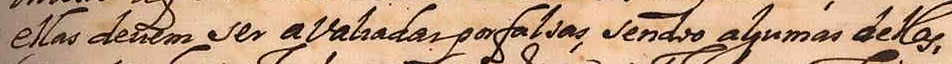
ellas deuem ser avaliadas por falsas, sendoo algumas dellas,
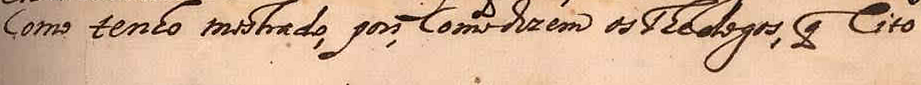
Como tenho mostrado, pois, Como dizem os Theologos, q̄ Cito
